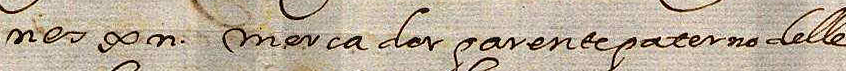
nes x n. mercador parente paterno delle
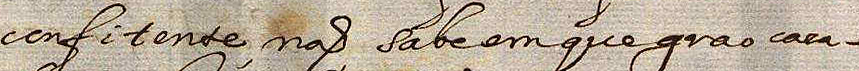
confitente, naõ sabe em que grao caza
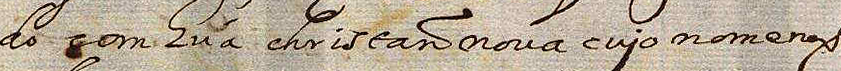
do com hūa christan̄ noua cujo nome naõ
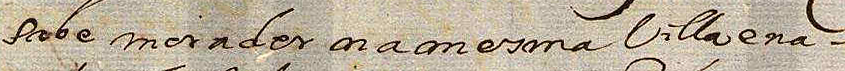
sabe, morador na mesma Villa, e na
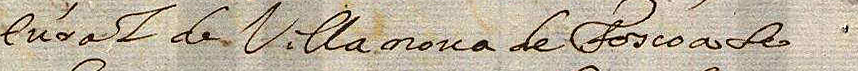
tural de Villa noua de Foscoa se
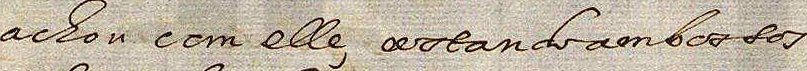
achou com elle, e estando ambos sos
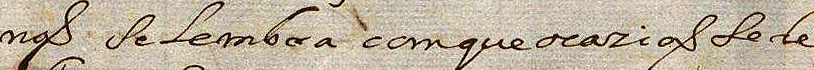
naõ se lembra com que ocaziaõ se de
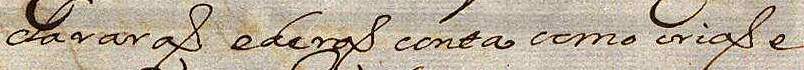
clararaõ e deraõ conta como criaõ e
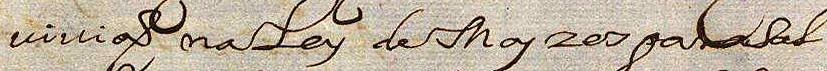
uiuiaõ na Ley de Moyzes para Sal
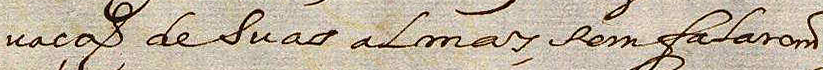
uaçaõ de Suas almas, sem falarem
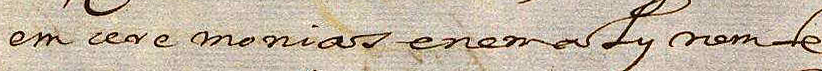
em ceremonias e nem aly nem de
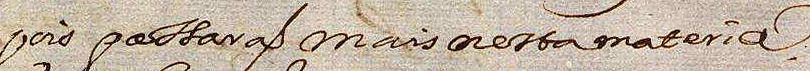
pois passaraõ mais nesta materia.
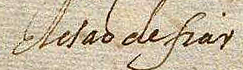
Resaõ de fiar
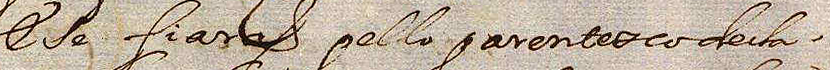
& se fiaraõ pello parentesco decla
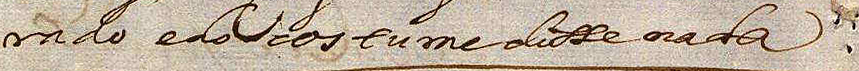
rado e ao costume disse nada
